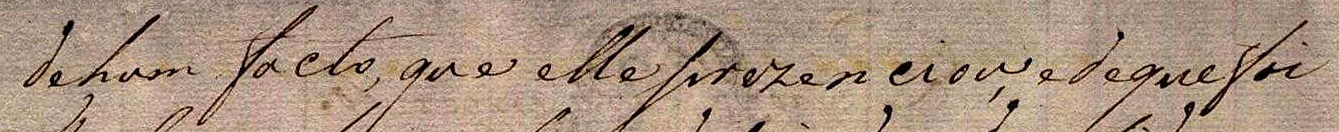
de hum facto, que elle prezençiou, e de que foi
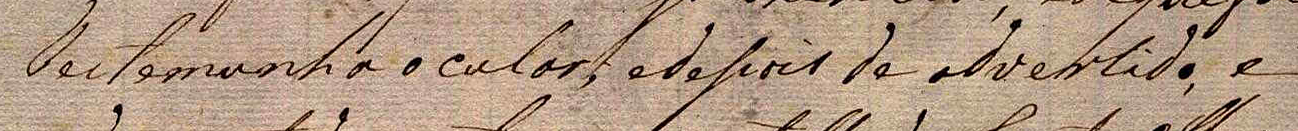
Testemunha ocular, e depois de advertido, e
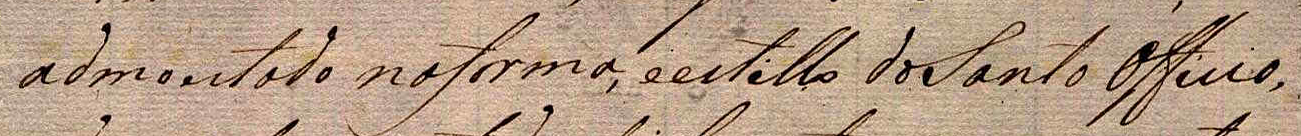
admoestado na forma, e estillo do Santo Officio,
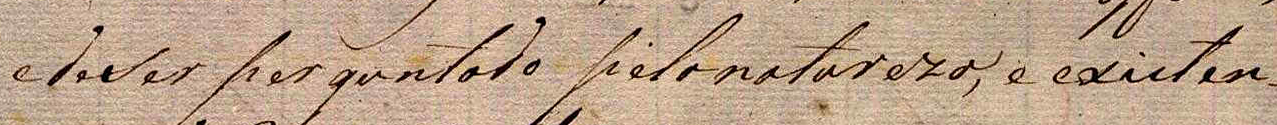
e de ser perguntado pela natureza, e existen
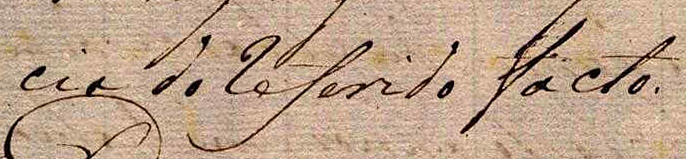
cia do Referido facto.
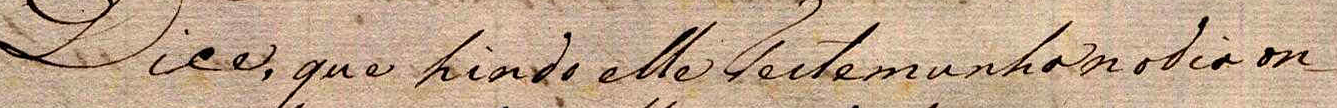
Dice, que hindo elle Testemunha no dia on
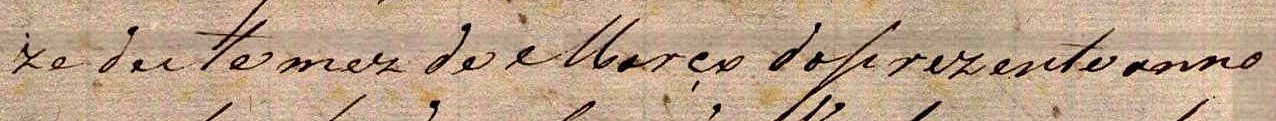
ze deste mez de Março do prezente anno
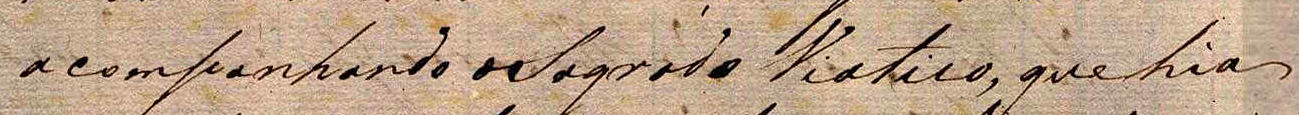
acompanhando o Sagrado Viatico, que hia
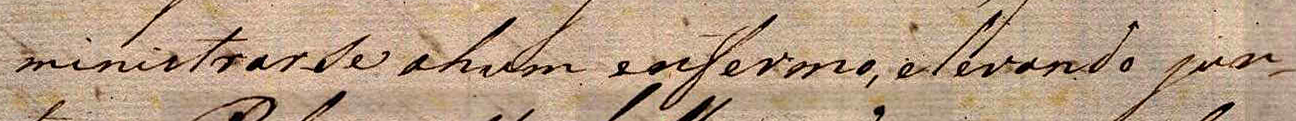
ministrarse a hum enfermo, e levando jun
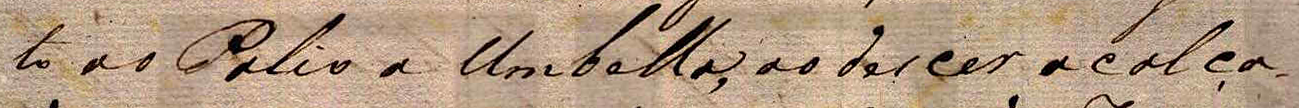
to ao Palio a Umbella, ao descer a calça
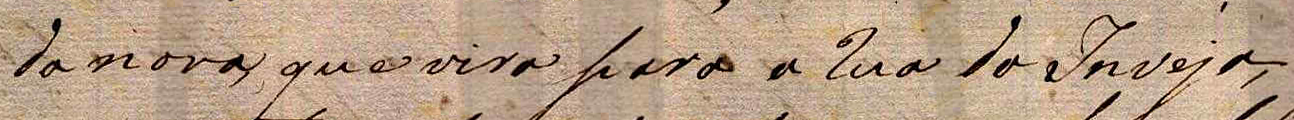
da nova, que vira para a Rua da Inveja,
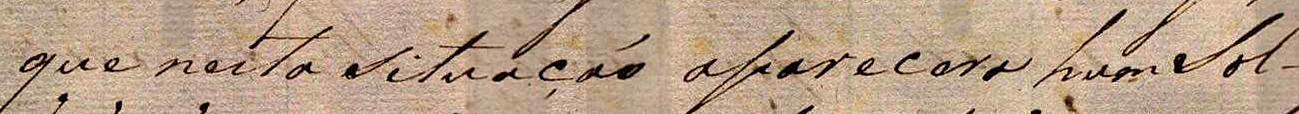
que nesta situaçaõ aparecera hum Sol
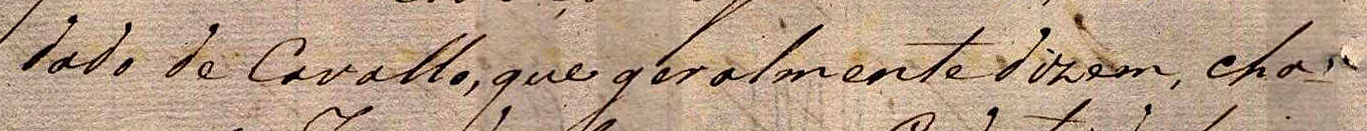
dado de Cavallo, que geralmente dizem, cha
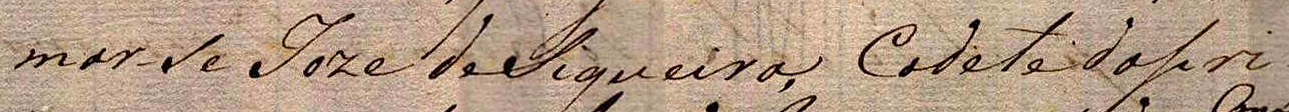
mar-se Ioze da Siqueira, Cadete da pri
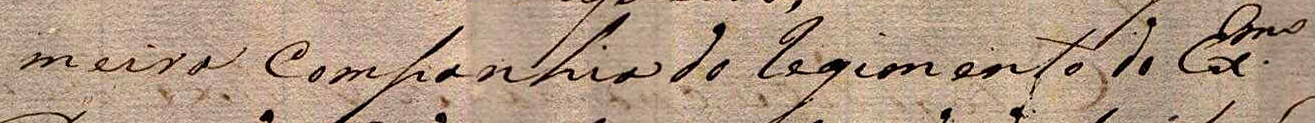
meira companhia do Regimento do Ex.mo
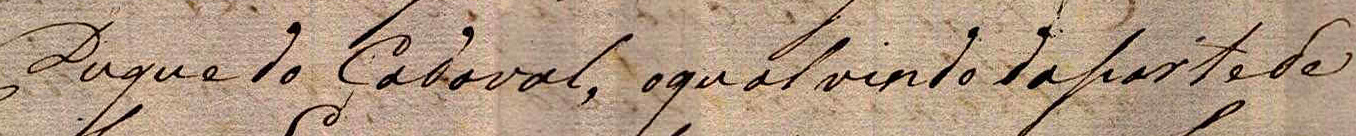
Duque do Cadaval, o qual vindo da parte de
